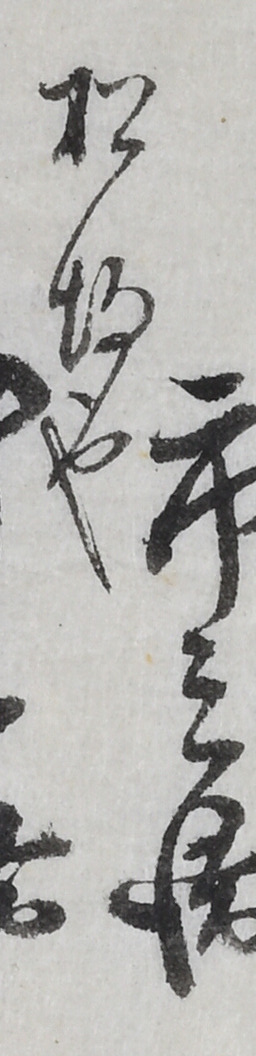松坂や
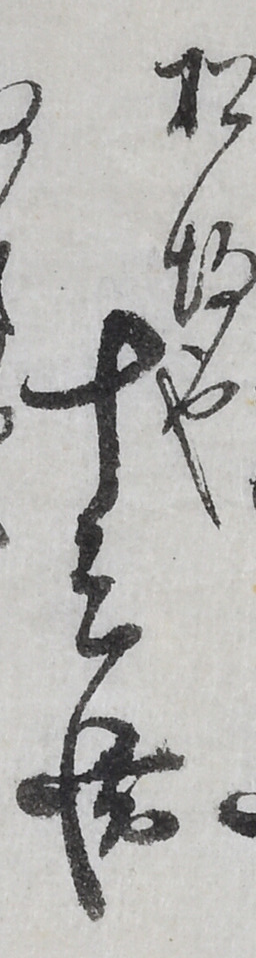十兵衛
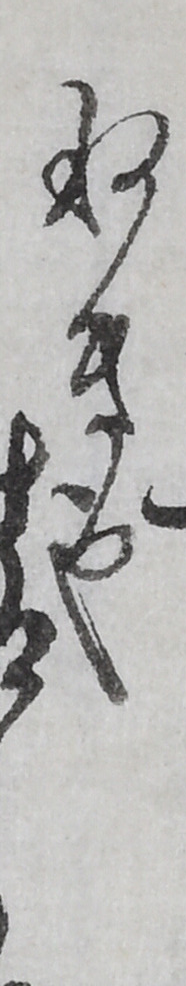ねきや
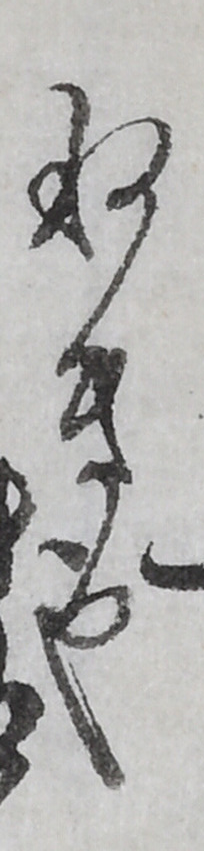ねきや
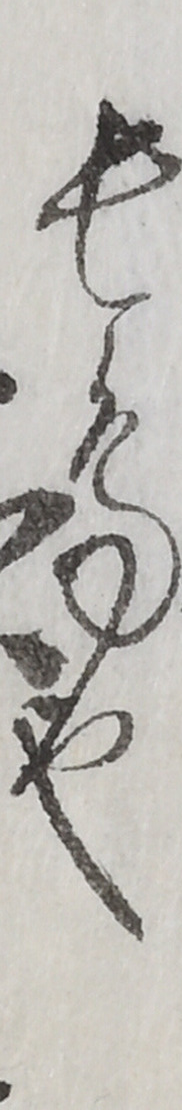長島や
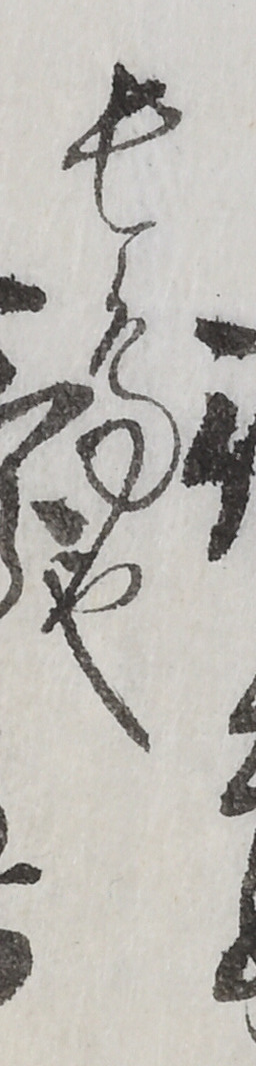長島や
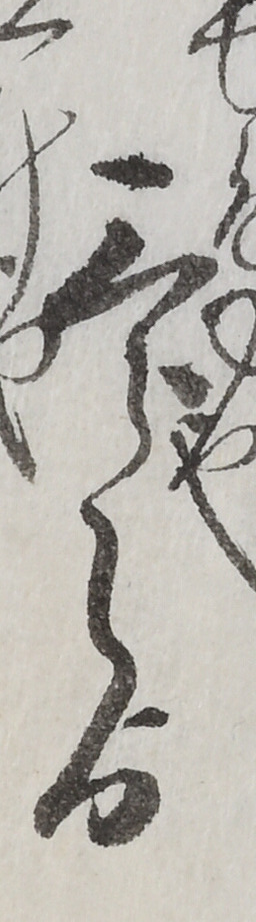三郎右衛門
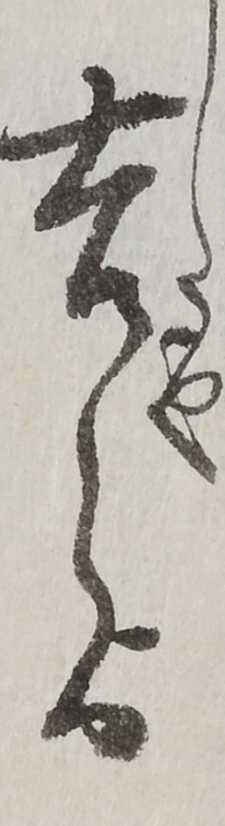清兵衛
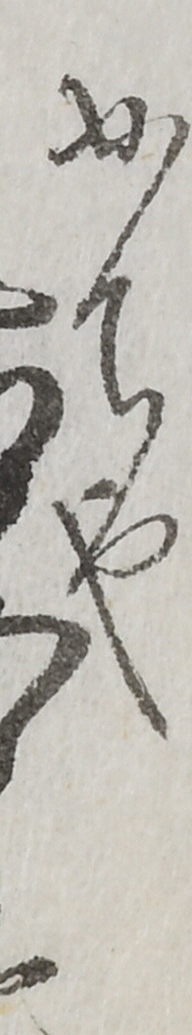かちや
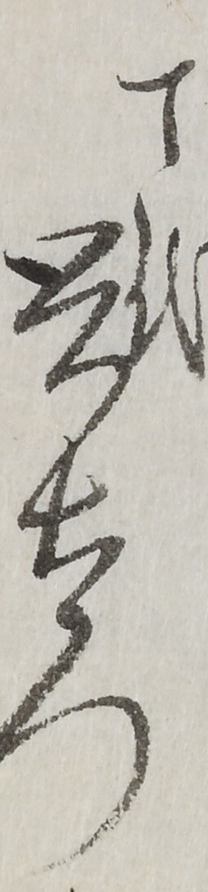吉右衛門
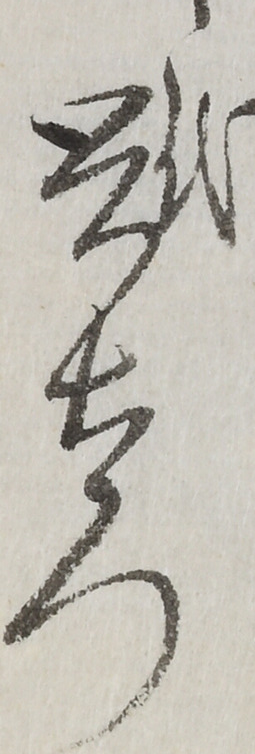吉右衛門

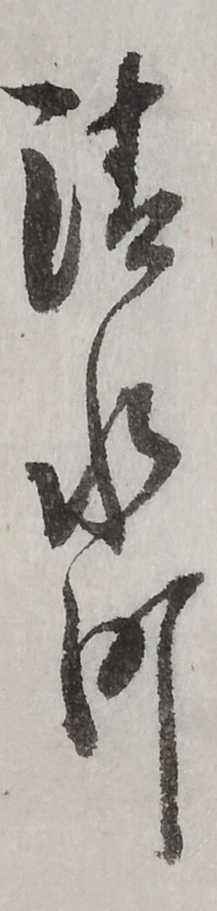清水町
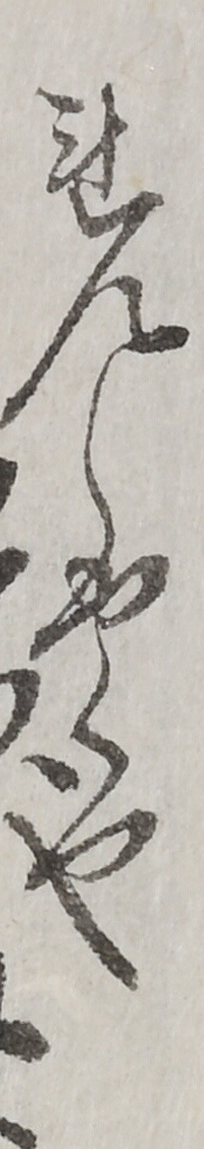れんしやくや

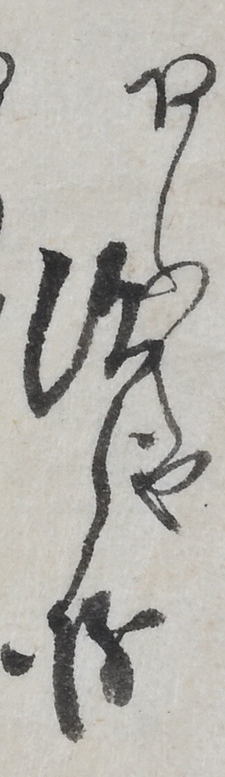惣右衛門
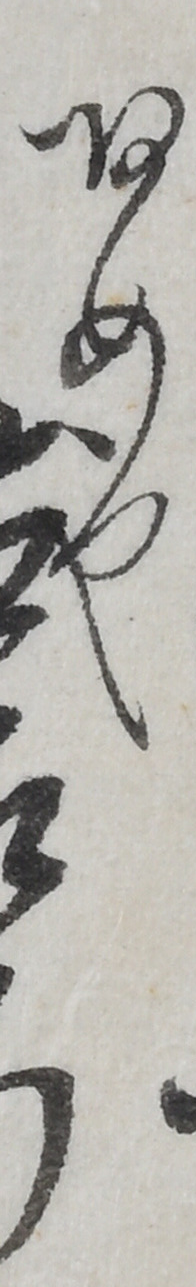かめや
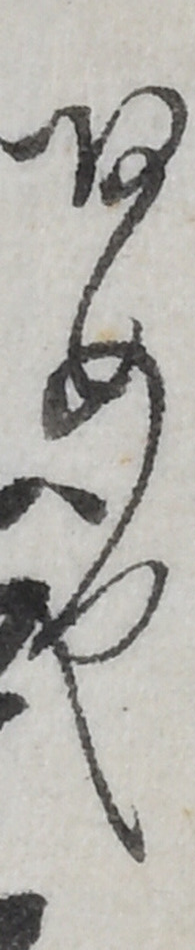かめや
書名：當町火消道具幷役附帳
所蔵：伊那市立高遠町図書館・合同会社AMANE
